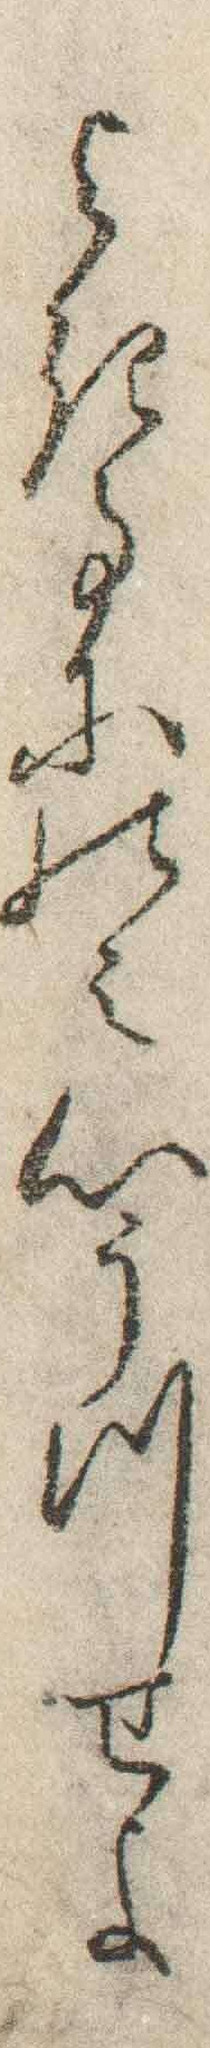よき事にのみ心うつせよ
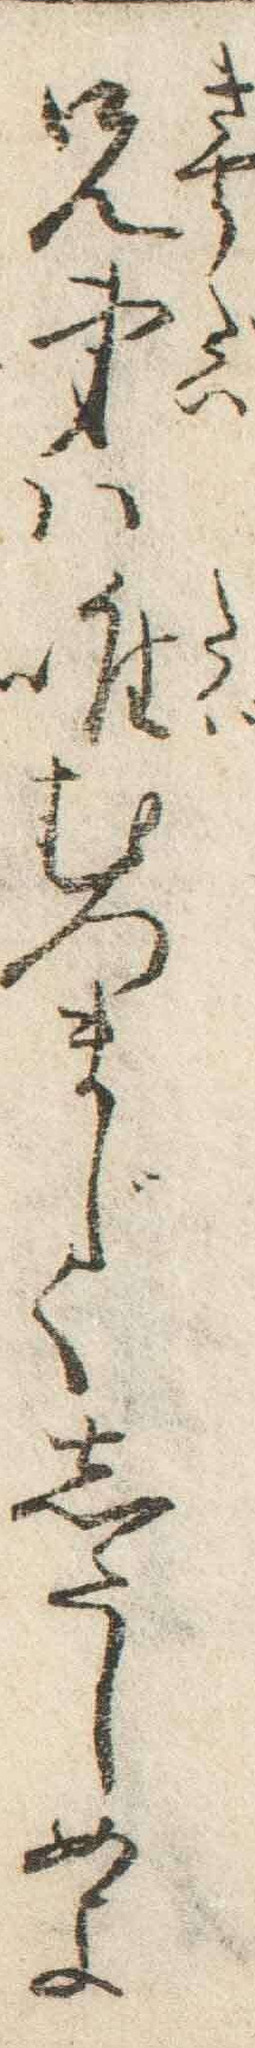兄弟は唯むつまじくしたしめよ
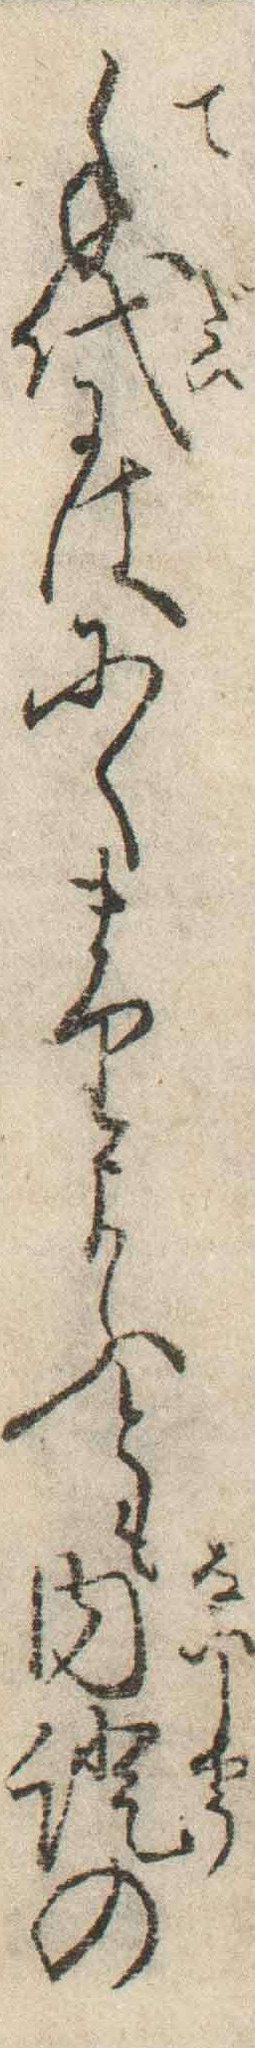手代にはにくまりようふとも内證の
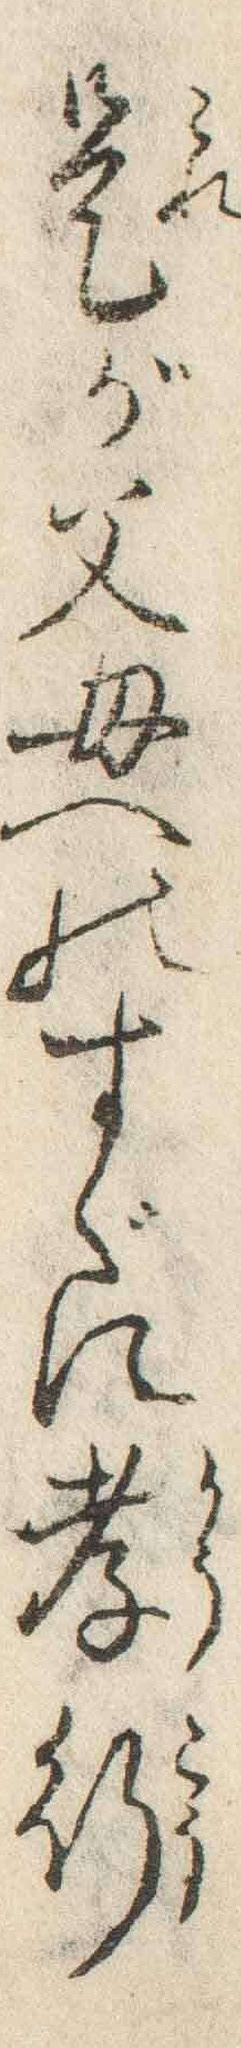是が父母へのすぐに孝行
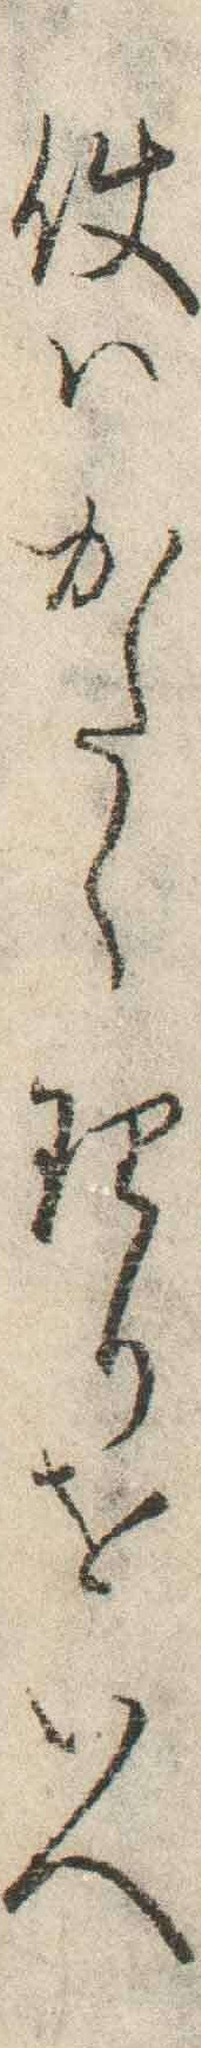使はかたく理りをいへ
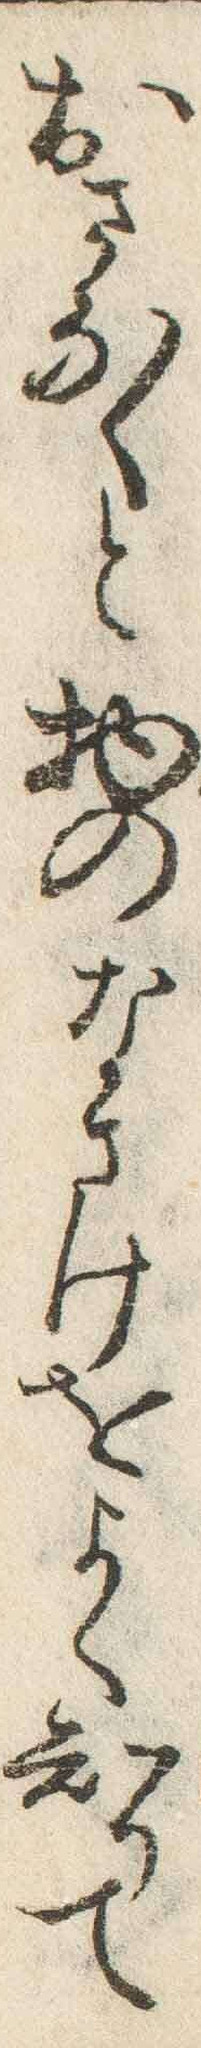おさなくと物のなさけをよく知りて
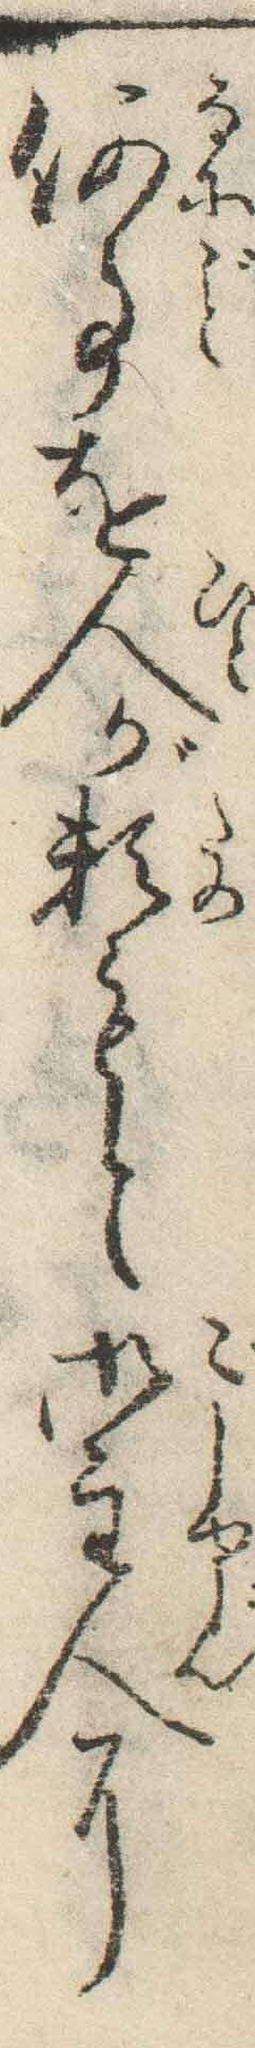何事を人が頼もと御主人に
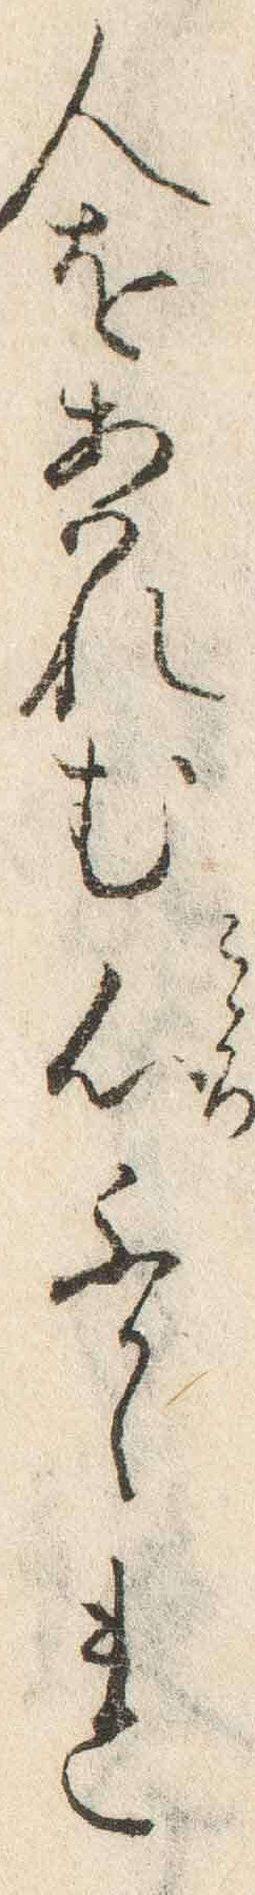人をあわれむ心ふかゝれ
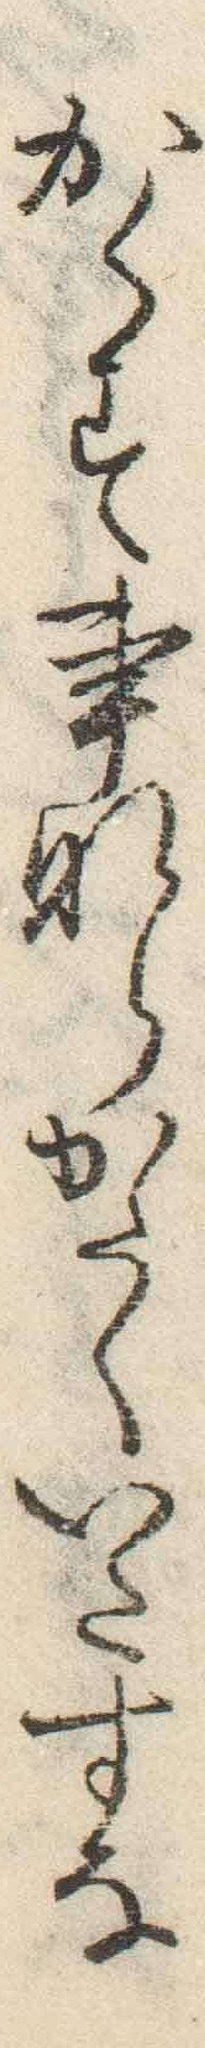かくす事ならかたくいたすな
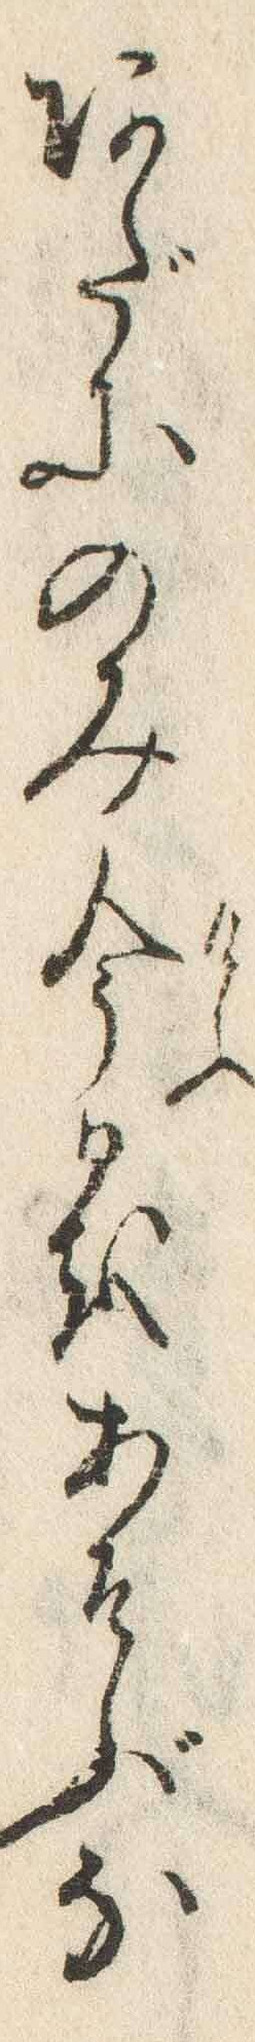あだにのみ今日をあそぶな
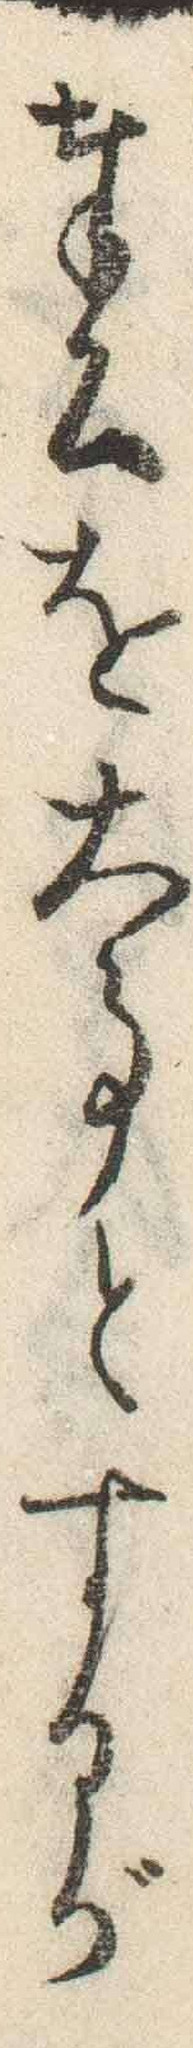奉公を大事とするが
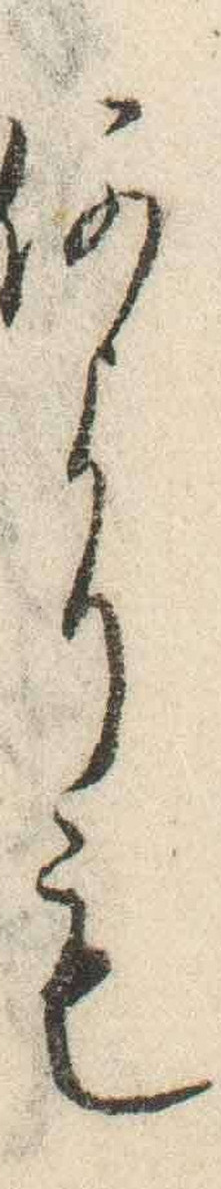何よりも
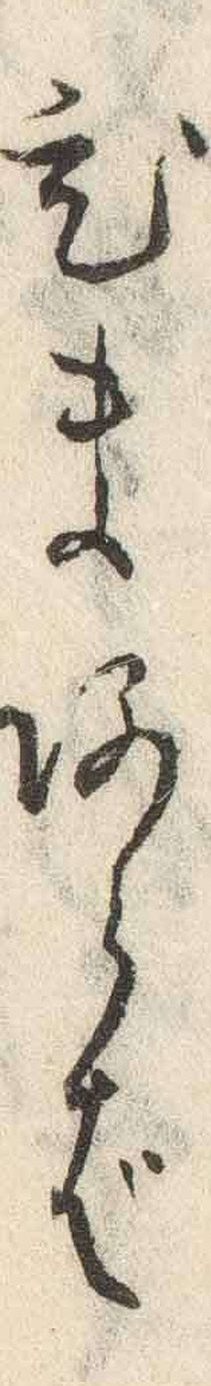ひまあらば
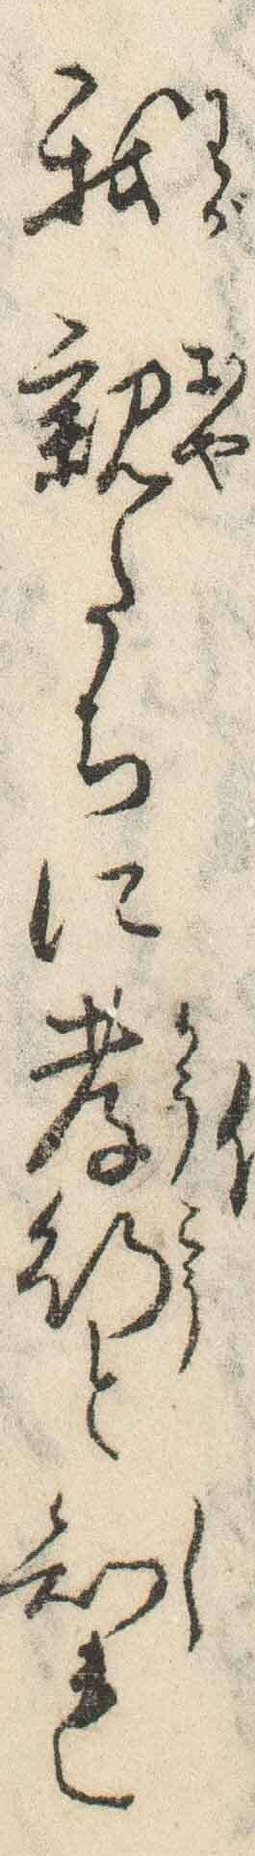我親たちに孝行と知れ
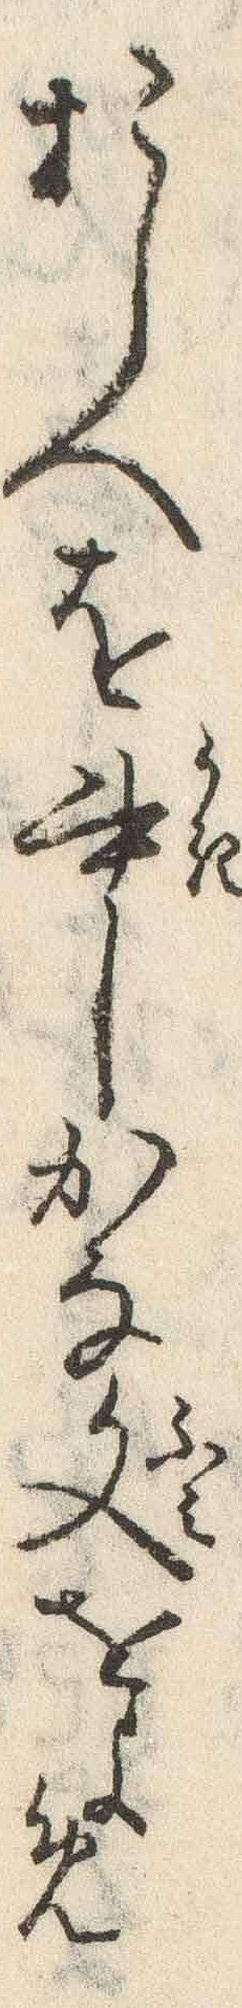おしへを書しかな文をよめ
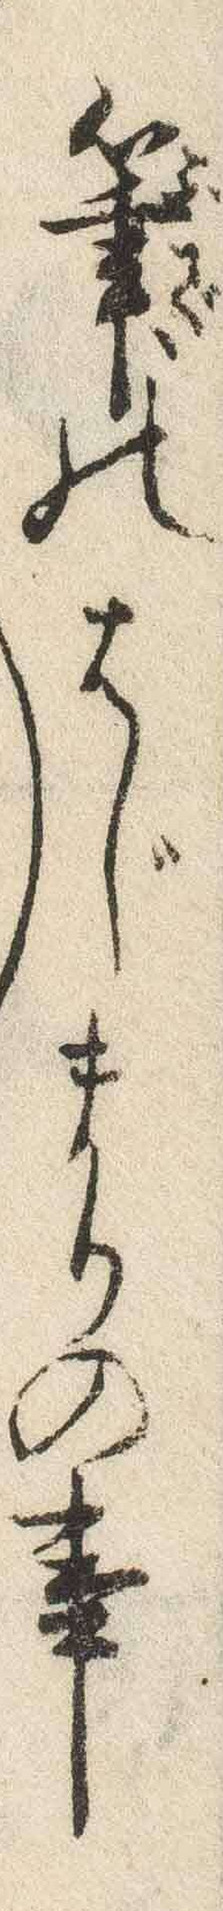筆のはじまりの事
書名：撫育草
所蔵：東京学芸大学附属図書館 国文学研究資料館
